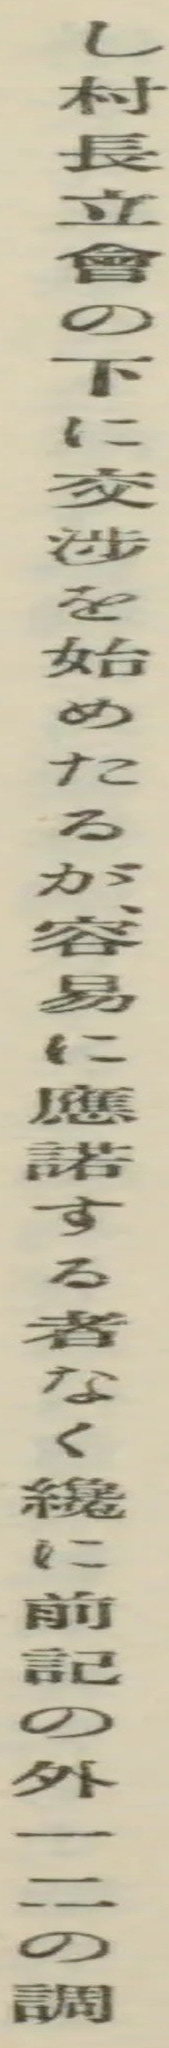し村長立合の下に交渉を始めたるが、容易に応諾する者なく纔に前記の外一二の調
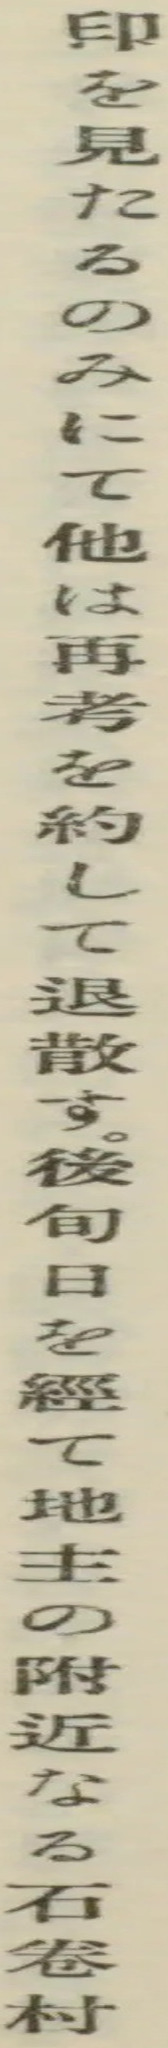印を見たるのみにて他は再考を約して退散す。後旬日を経て地主の附近なる石巻村
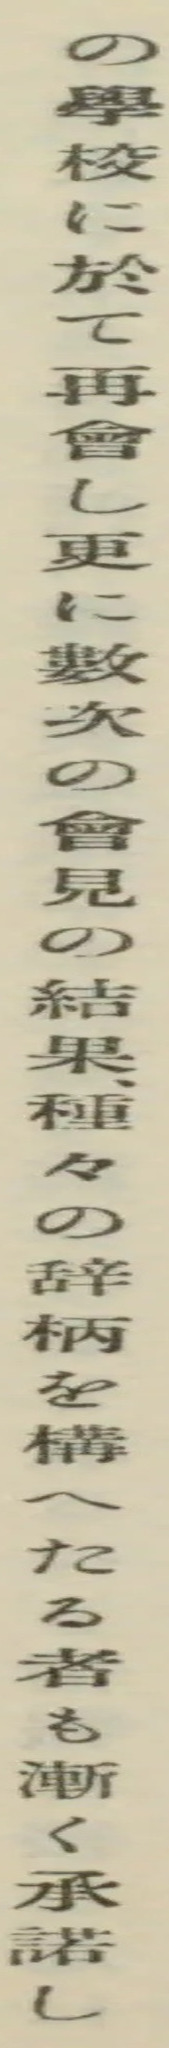の学校に於て再会し更に数次の会見の結果、種々の辞柄を構へたる者も漸く承諾し
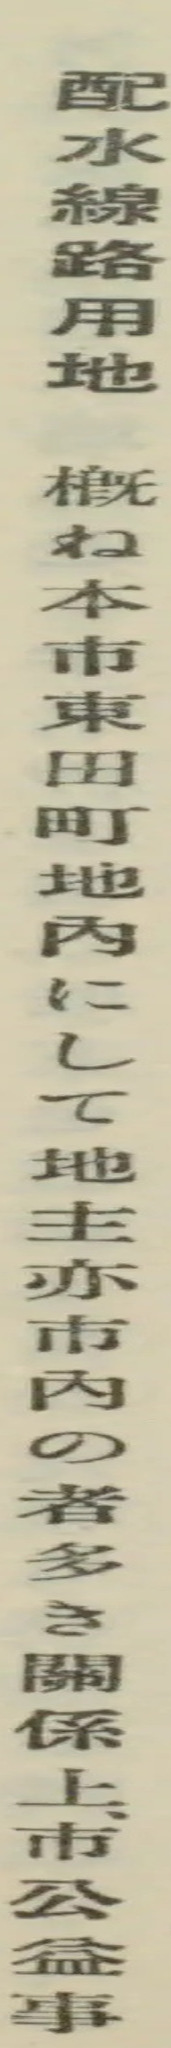配水線路用地概ね本市東田町地内にして地主亦市内の者多き関係上、市公益事
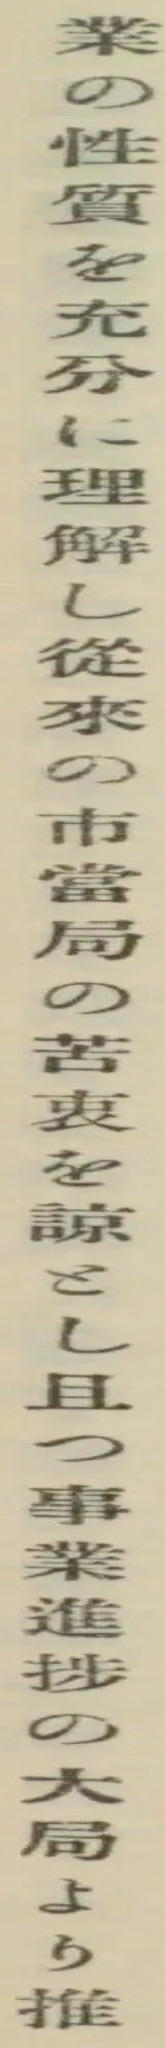業の性質を十分に理解し従来の市当局の苦衷を諒とし且つ事業進捗の大局より推
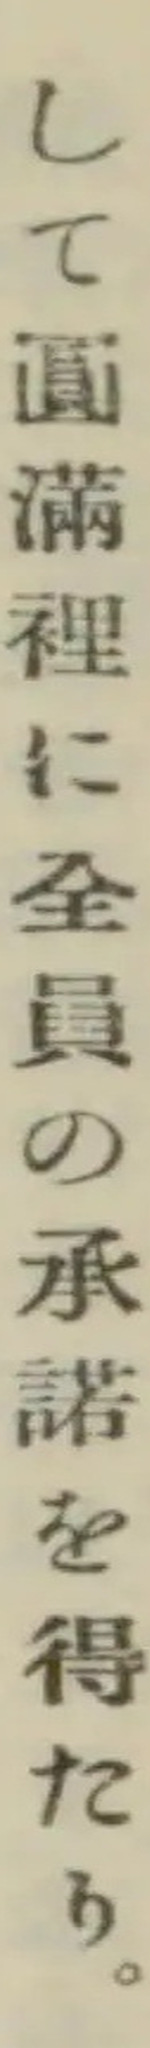して圓満裡に全員の承諾を得たり。
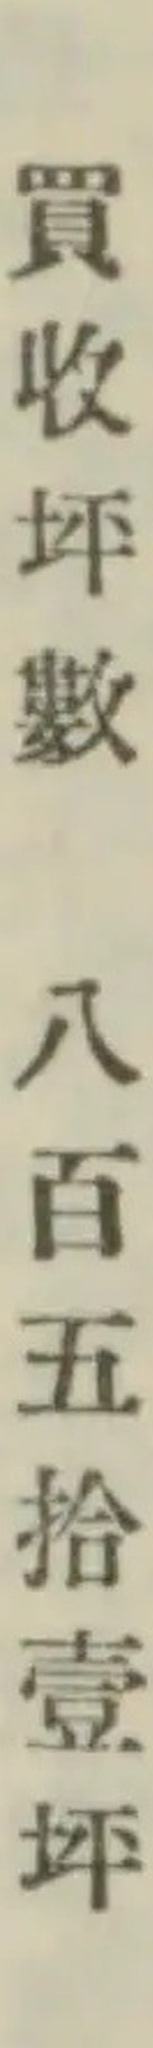買収坪数八百五拾壹坪
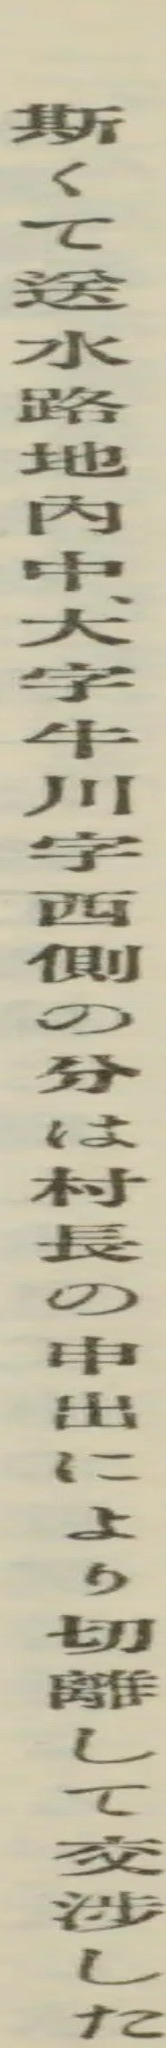斯くて送水路地内中、大字牛川字西側の分は村長の申出により切離して交渉した
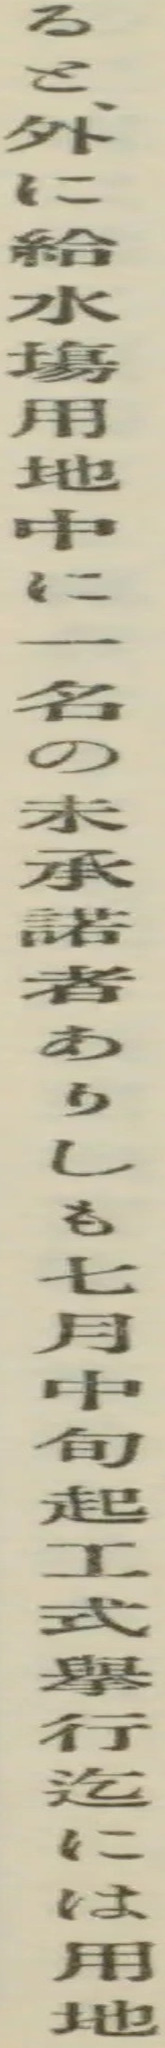ると、外に給水場用地中に一名の未承諾者ありしも七月中旬起工式挙行迄には用地
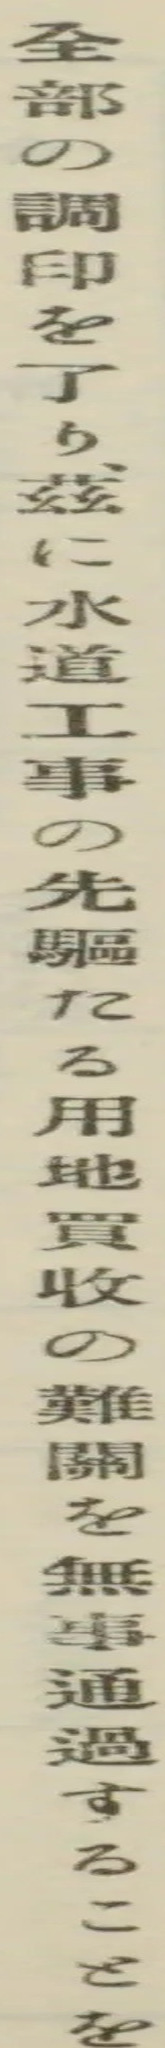全部の調印を了り、茲に水道工事の先駆たる用地買収の難関を無事通貨することを
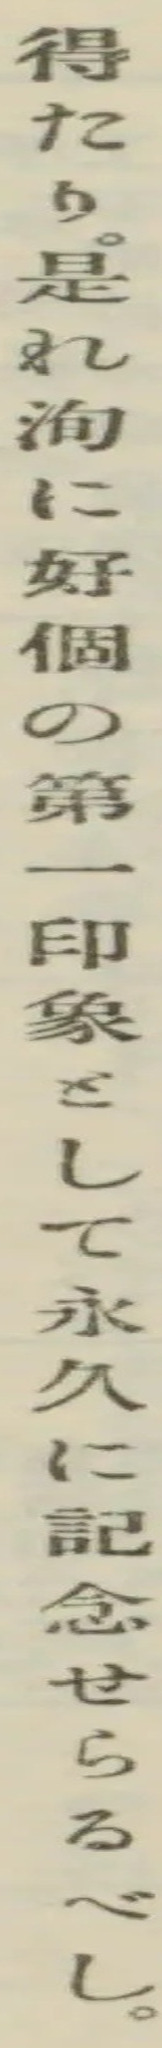得たり。是れ洵に好個の第一印象として永久に記念せらるべし。
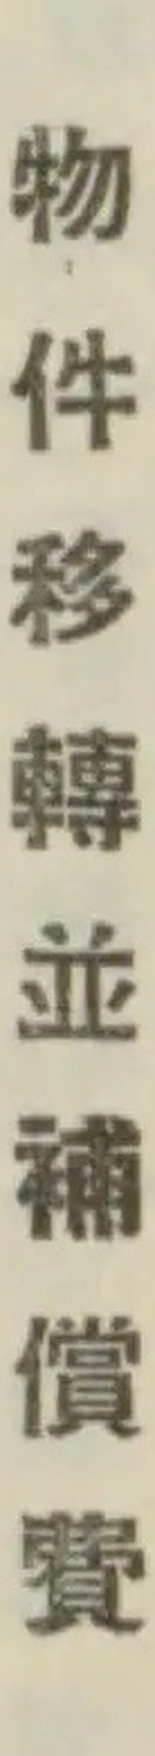物件移轉並補償費
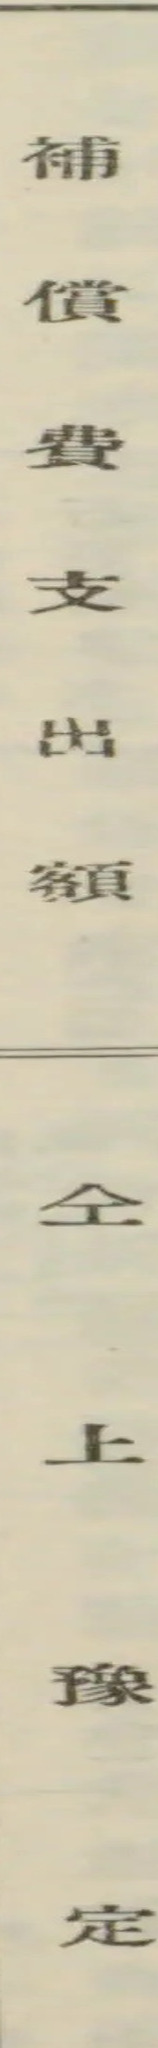補償費支出額同上予定

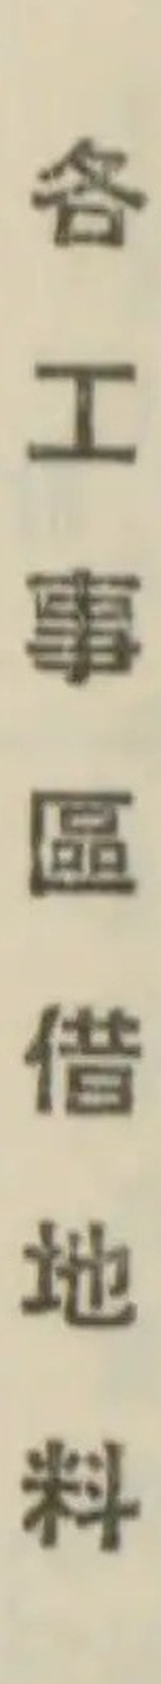各工事区借地料
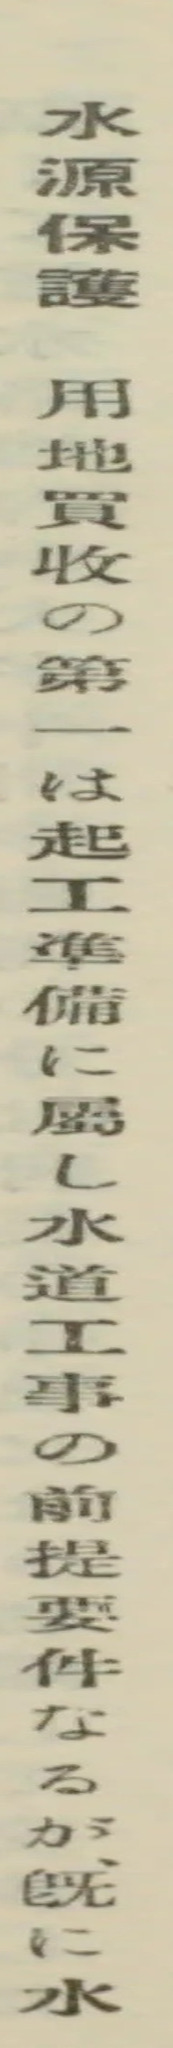水源保護用地買収の第一は起工準備に屬し水道工事の前提要件なるが、既に水
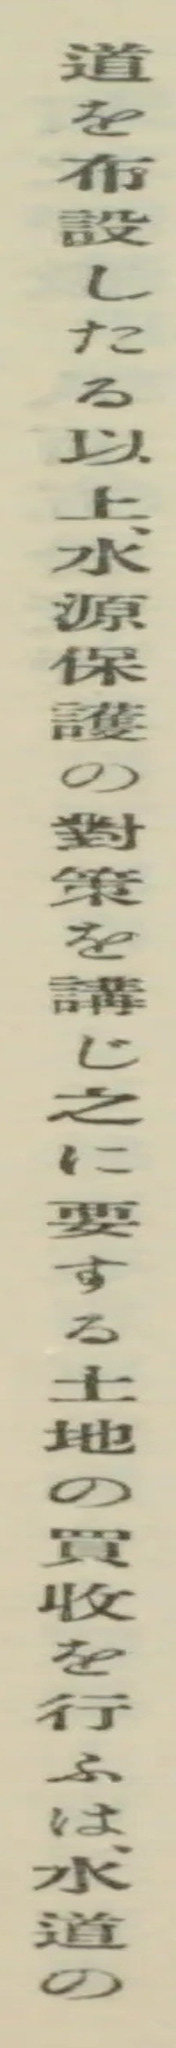道を布設したる以上、水源保護の対策を講じ之に要する土地の買収を行ふは、水道の
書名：豊橋市水道誌
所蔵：国立国会図書館 National Diet Library, JAPAN
